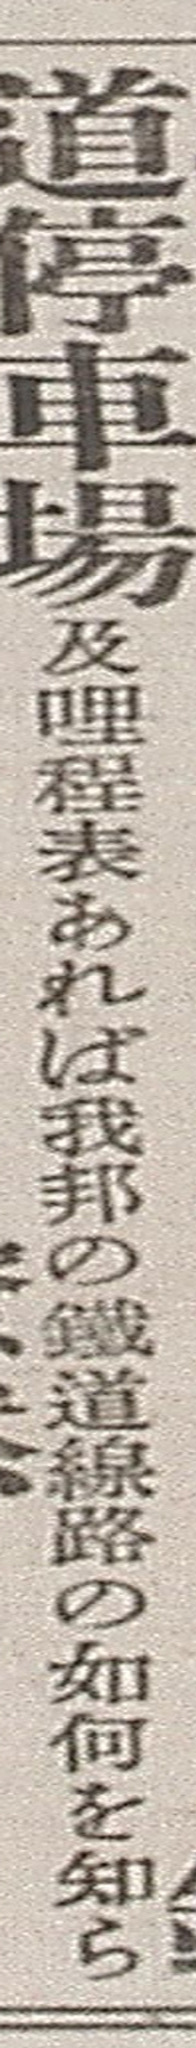道停車場及哩程表あれば我邦の鉄道線路の如何を知ら
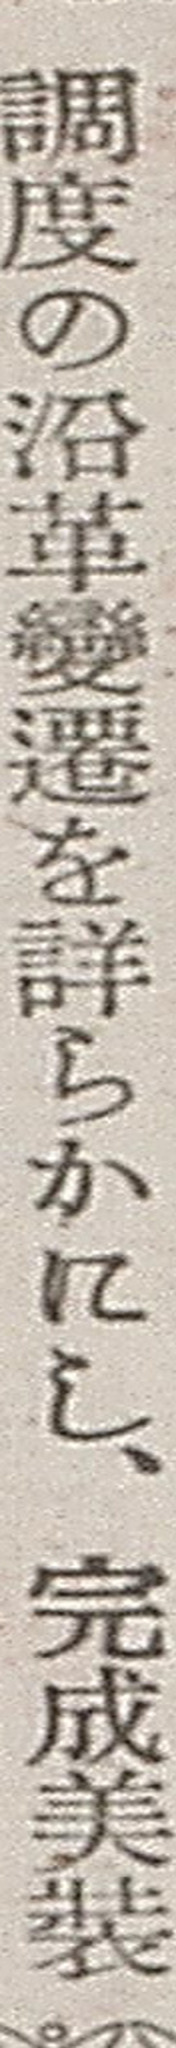調度の沿革変遷を詳らかにし、完成美装
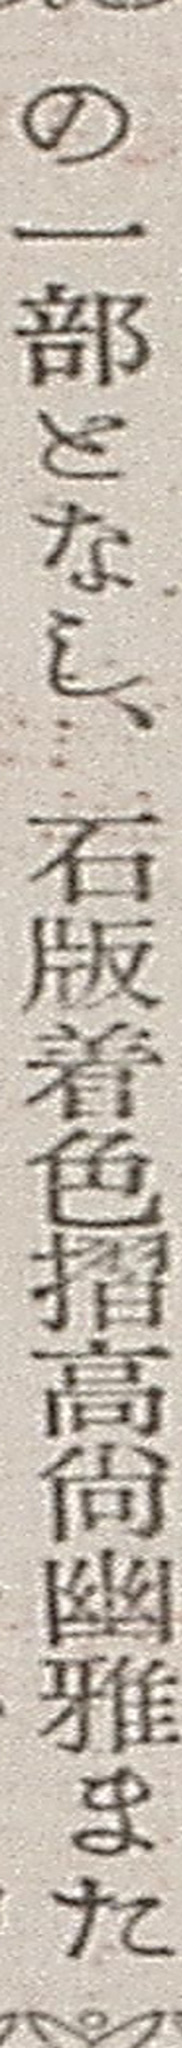の一部となし、石版着色摺高尚幽雅また
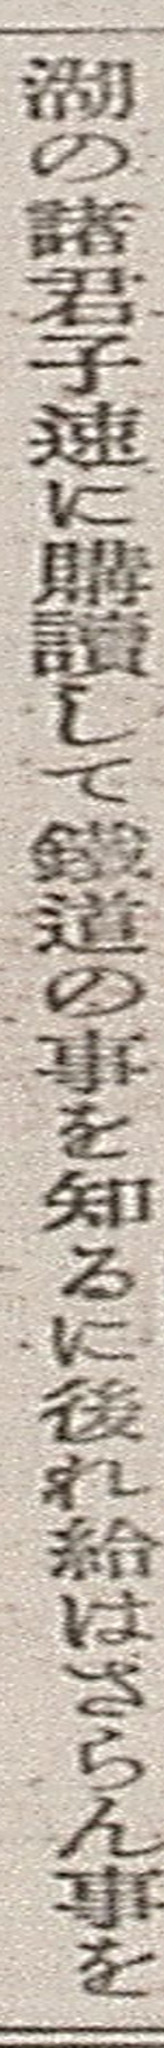湖の諸君子速に購読して鉄道の事知るに後れ給はさらん事を
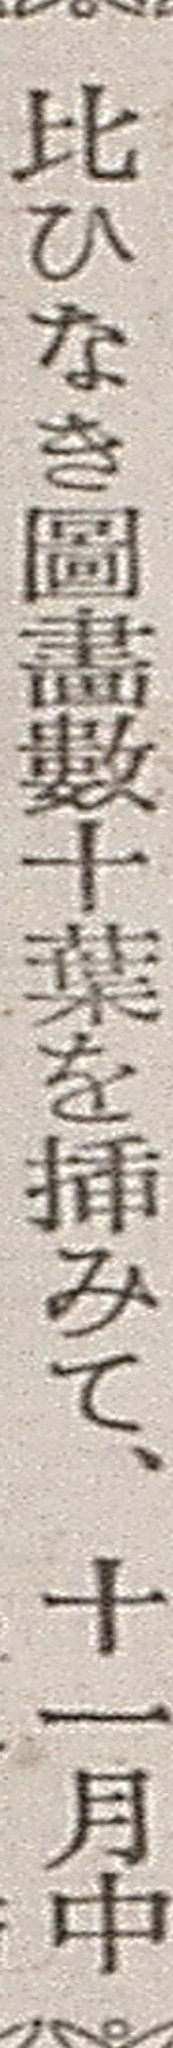比ひなき図画数十葉を挿みて、十一月中
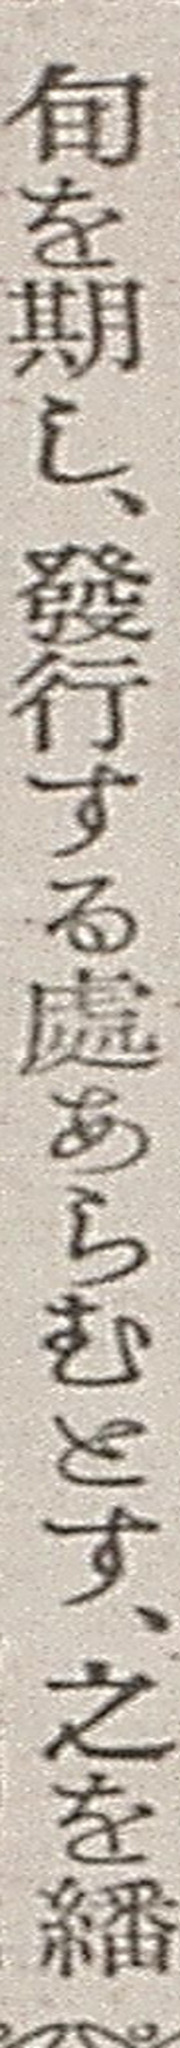旬を期し、発行する処あらむとす、之を繙
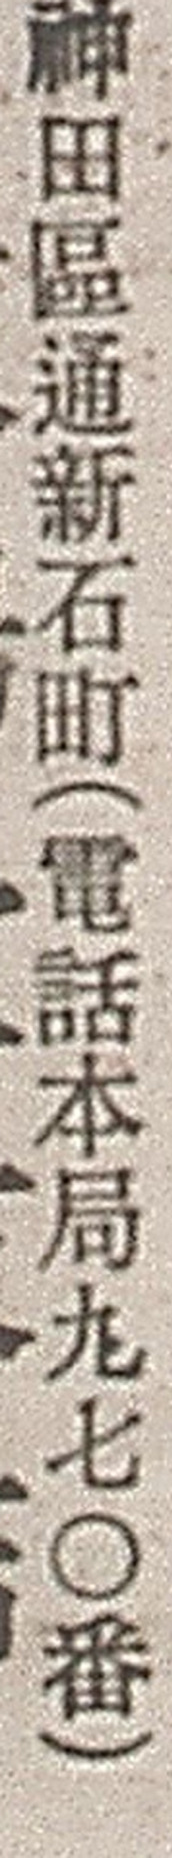神田區通新石町
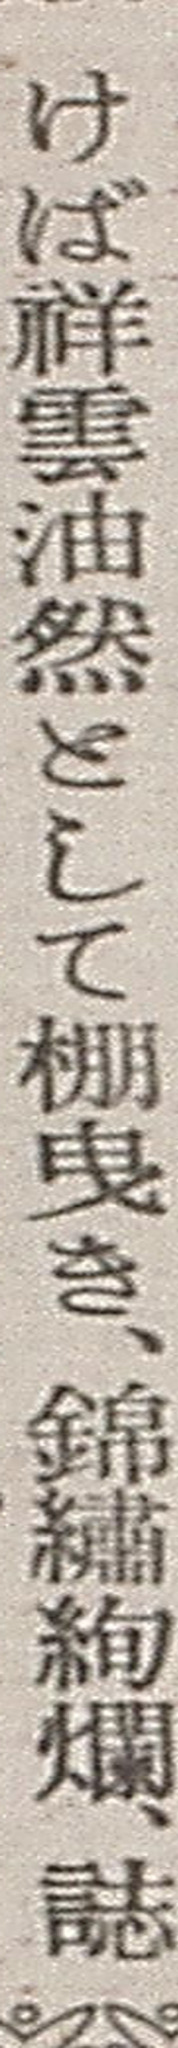けば祥雲油然として棚曳き、錦繍絢爛、誌
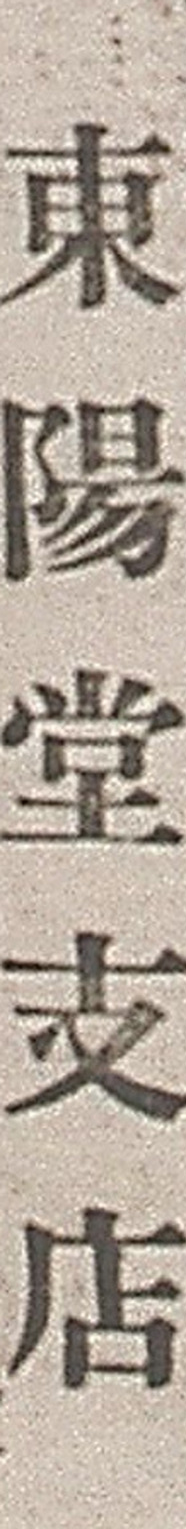東陽堂支店
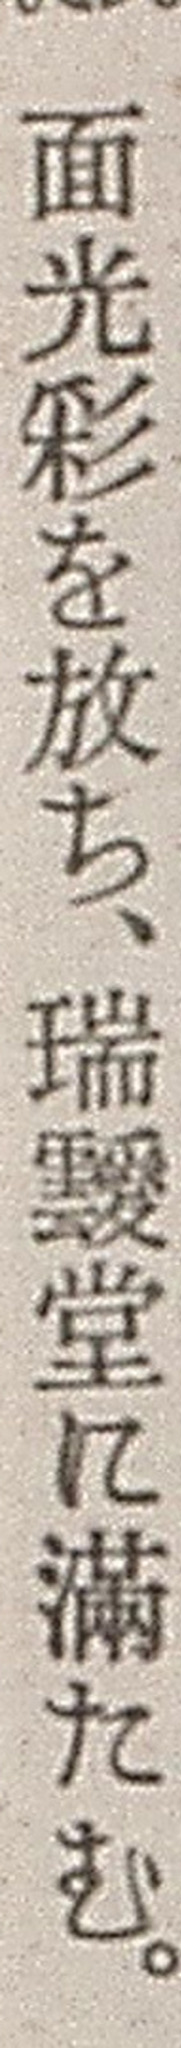面光彩を放ち、瑞靉堂に満たむ。
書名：風俗畫報臨時増刊第百九十九號　明治三十二年十月各地災害圖會（前編之續）
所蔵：東京大学地震研究所図書室 Earthquake Research Institute Library, The University of Tokyo, JAPAN
